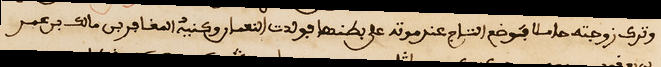وترك زوجته حاملا فوضع التاج عند موته على بطنها فولدت النعمان وكنيه المغافر بن مالك بن عمر
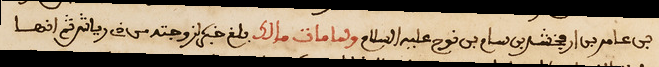بن عامر بن ارفخشد بن سام بن نوح عليه السلام ولما مات مالك بلغ خبره لزوجته من ذى رياش ثم انها
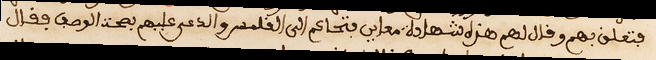فتعلق بهم وقال لهم هذه شهادة معاين فتحاكم الى القلمس والدعى عليهم بصحة الوصف فقال
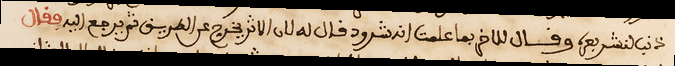ذنب لنشر بعره وقال للاخر بما علمت انه شدود قال له لان الاثر يخرج عن الطريق ثم يرجع اليه فقال
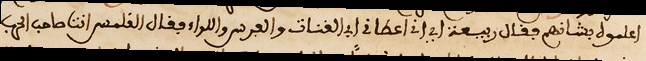اعلموه بشانهم فقال ربيعة اني انى اعطانى ابي القنات والفرس واللواء فقال القلمس انت صاحب الحرب
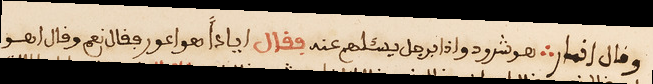وقال انمار هو شدود واذا برجل يسئلهم عنه فقال ايادًا هو اعور فقال نعم وقال اهو
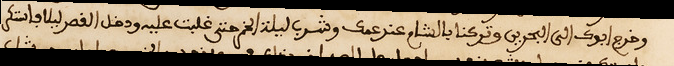وخرج ابوك الى البحرين وتركنا بالشام عند عمك وشرب ليلة الخمر حتى غلبت عليه ودخل القصر ليلا فاستكر
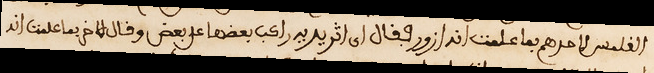القلمس لاحدهم بما علمت انه ازور فقال اى اثر يديه راكب بعضها على بعض وقال للاخر بما علمت انه
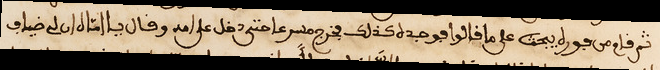ثم قام من فوره يبحث على ما قالوا فوجده كذلك فخرج مسرعا حتى دخل على امه وقال يا امّاه ان لى ضياف
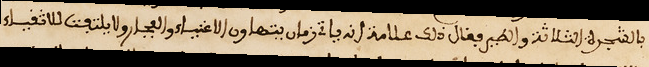بالشجرة الثلاثة والطير فقال ذلك علامة انه ياتى زمان يتهاون الاغنياء والفجار ولا يلتفت للاثقياء
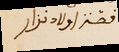قصة اولاد نزار
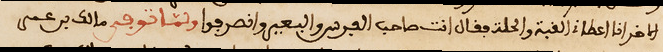الاخر انا اعطانى القبة والحلة فقال انت صاحب الفرس والبعير وانصرفوا ولمّا توفى مالك بن عمر
